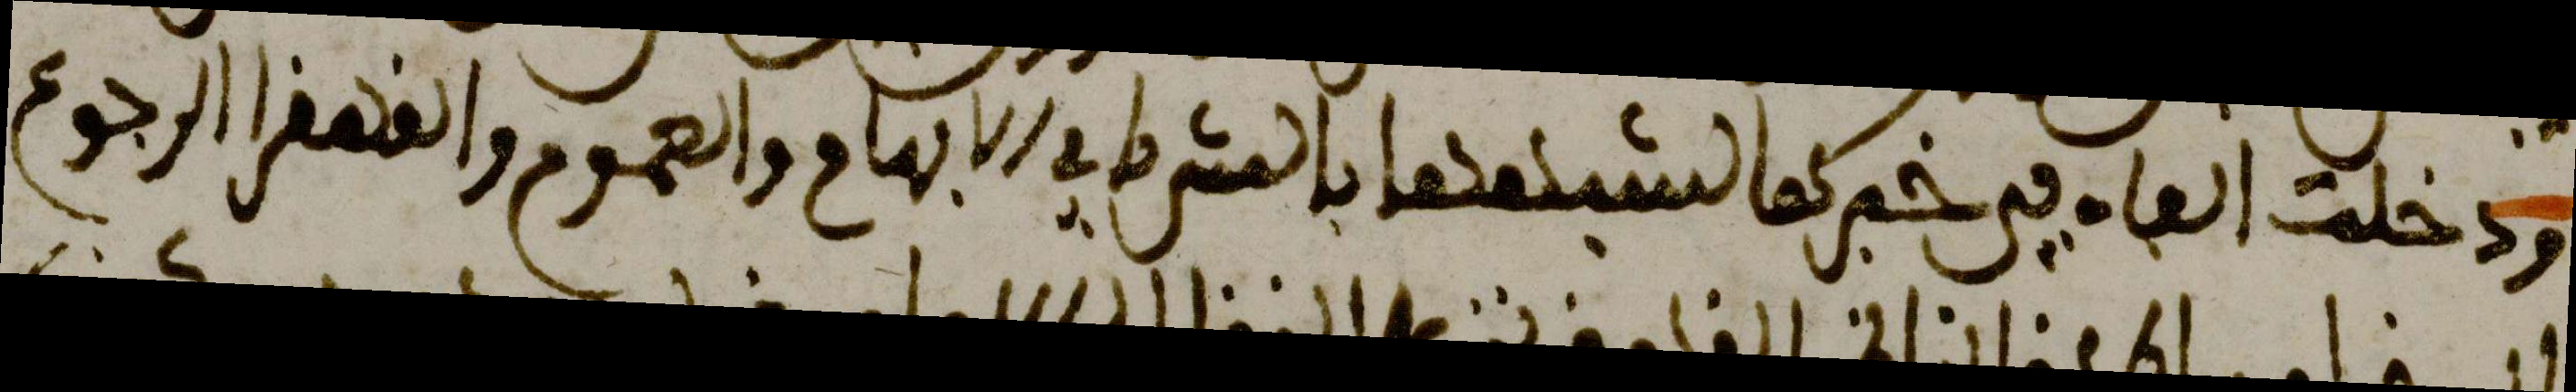ودخلت الفاء في خبرها الشبهها بالشرط في الابهام والعموم والقهقرا الرجوع
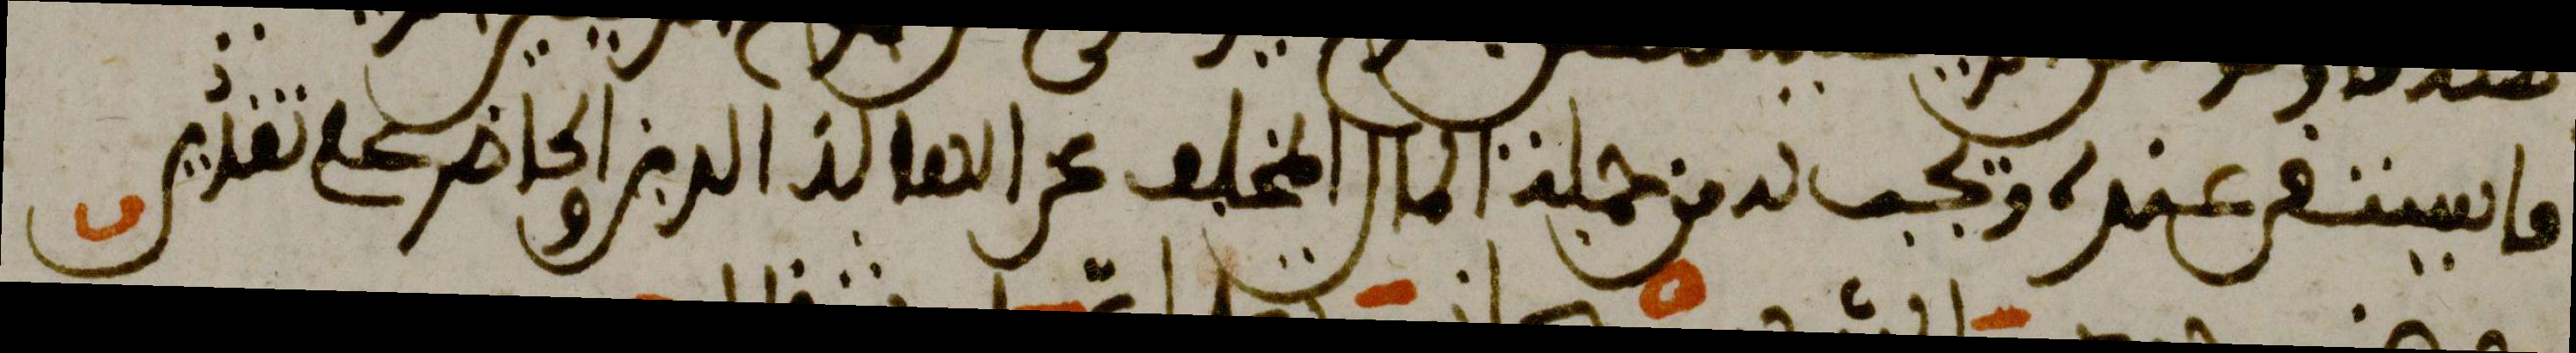ما يستقر عنده و يجب له من جملة المال المخلف عن الهالك الدين والحاضر على تقدير
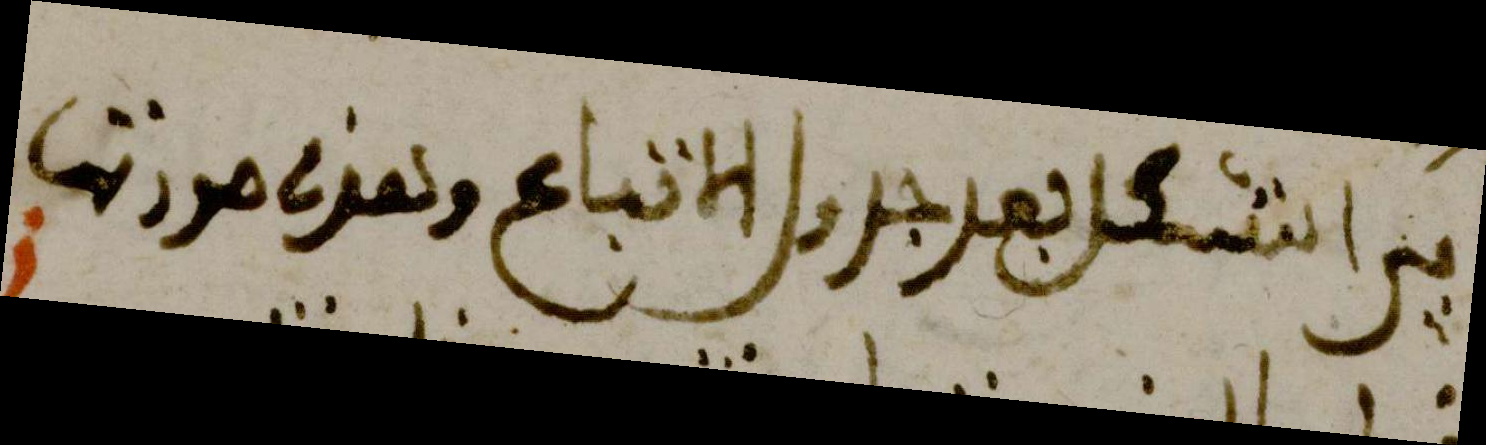في التشكيل بعد جدول الاتباع وهذه صورتها
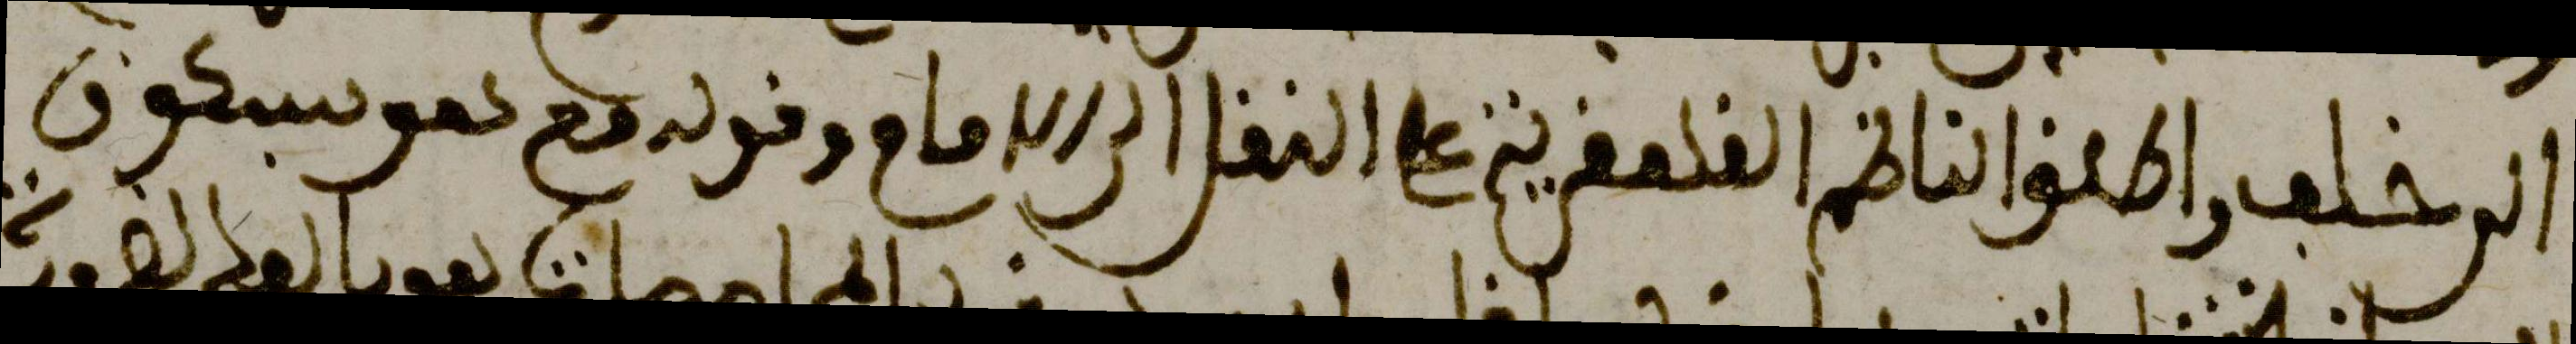الى خلف واطلق الناظم القهقرية على النقل الى الامام وقوله مع هو بسكون
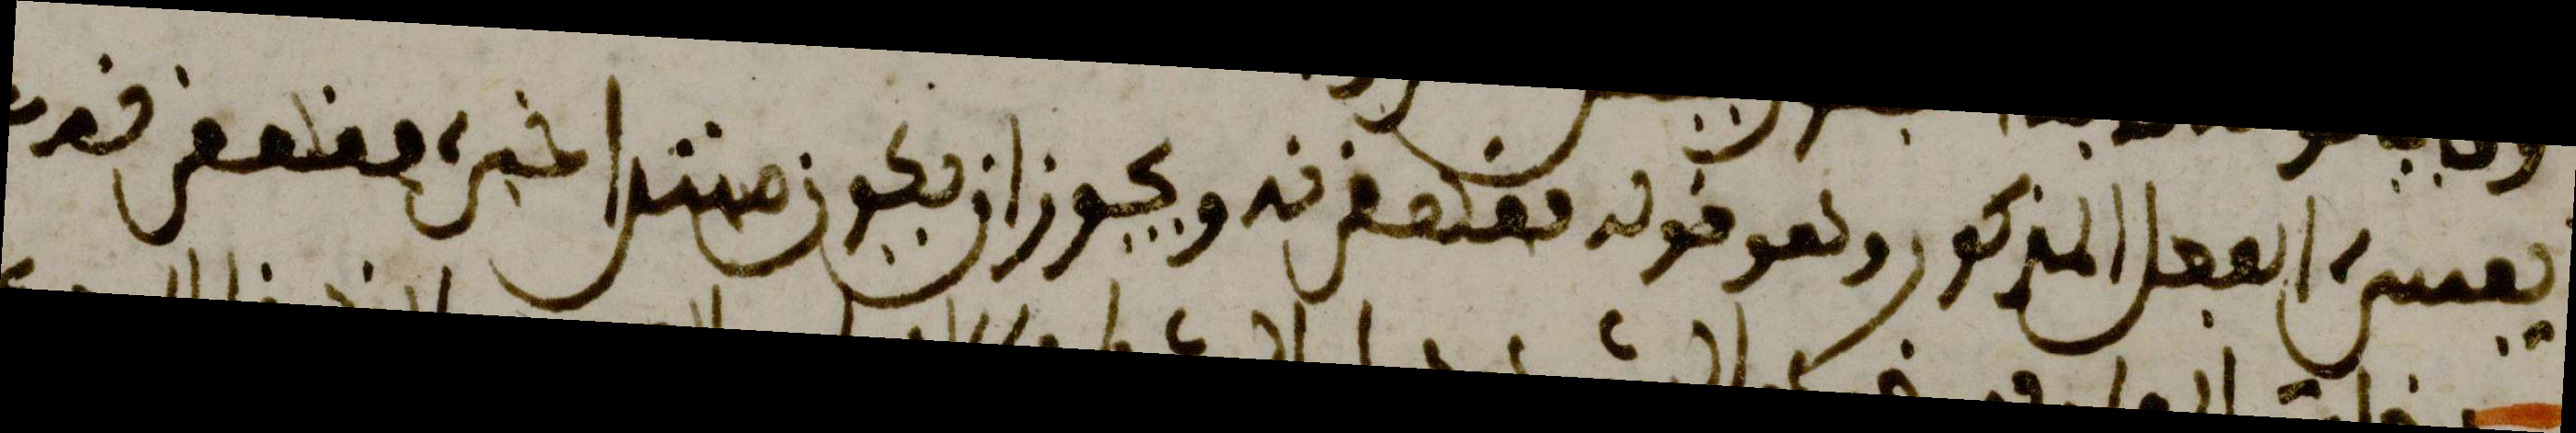يفسر الفعل المذكور وهو قوله فقهقرنه ويجوزان يكون مبتدا خبره فقهقرنه
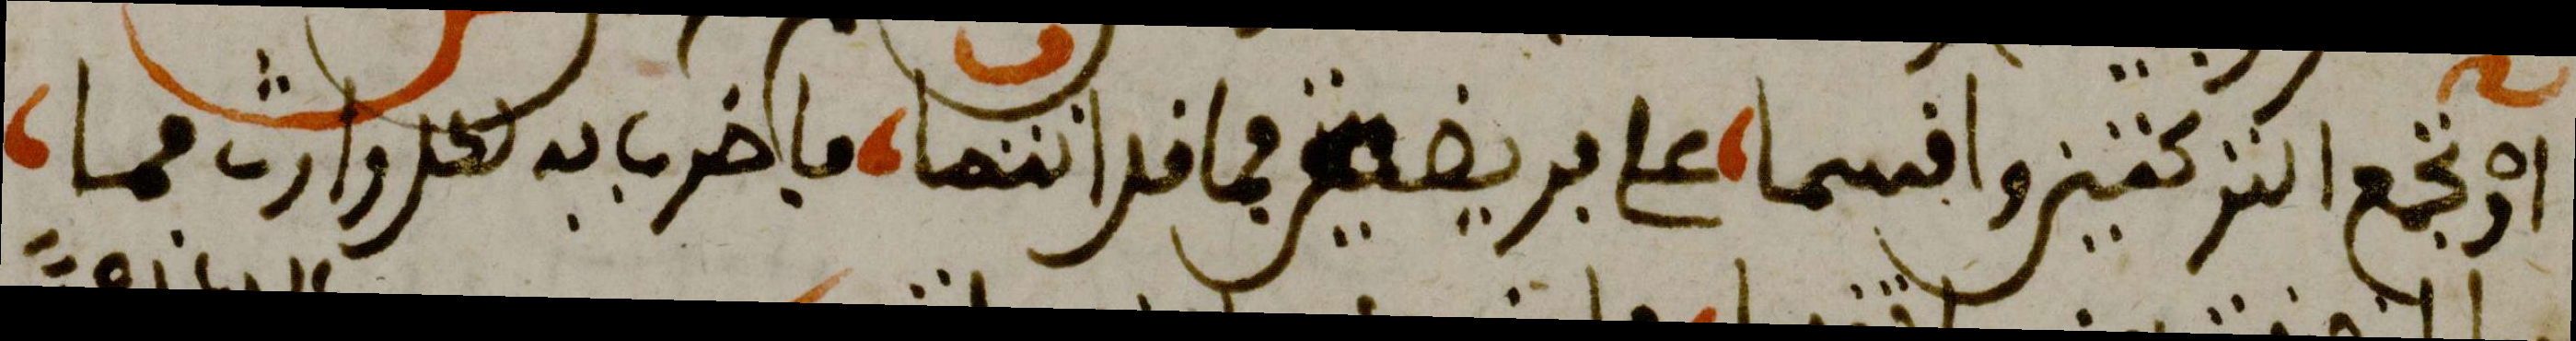حضور جميعه والله سبحانه وتعلى اعلم ثم قال ص
